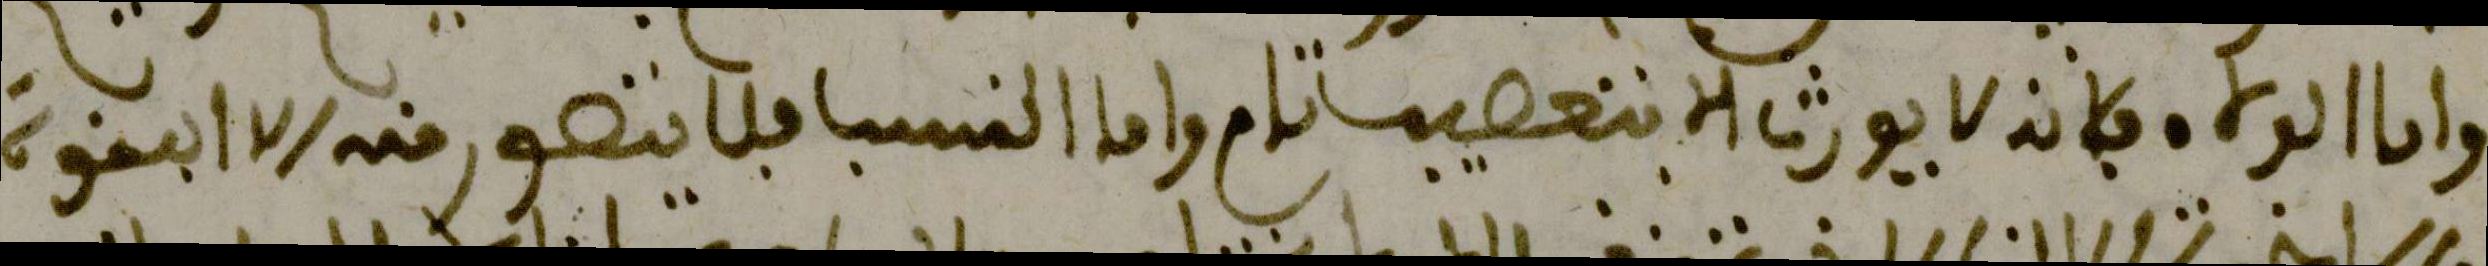واما الولاء فلانه لا يورث الا تعصيب تام واما النسب فلا يتصور منه الا البنوة
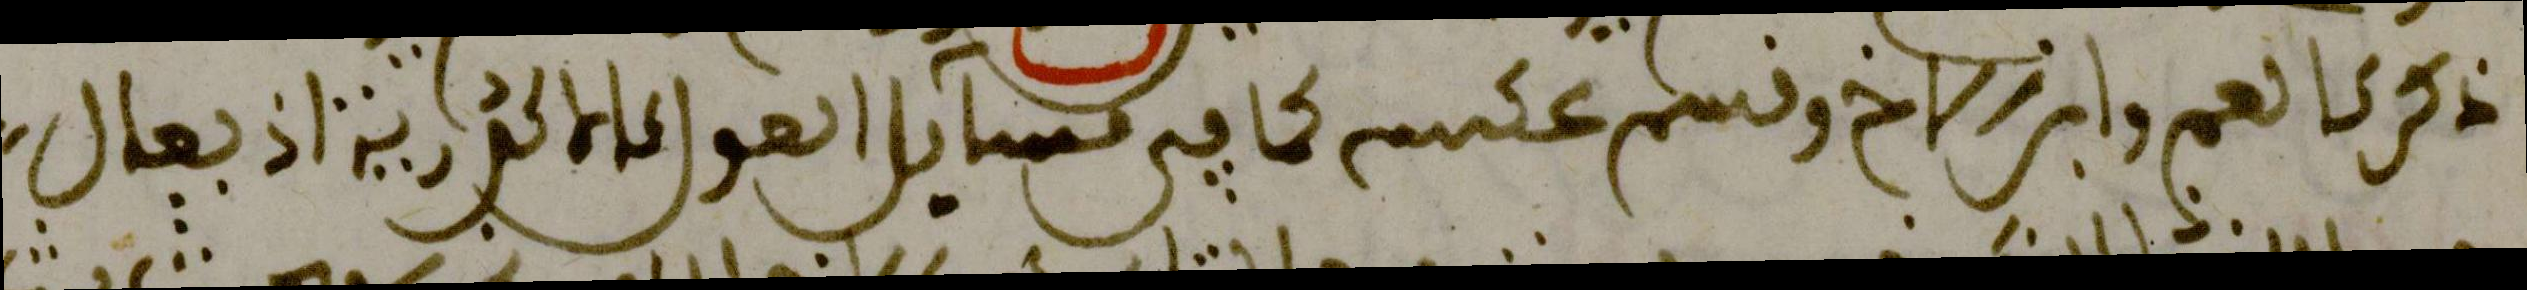ذكر كالعم وابن الاخ وقسم عكسه كما في مسائل العول كالاكدرية اذ يعال
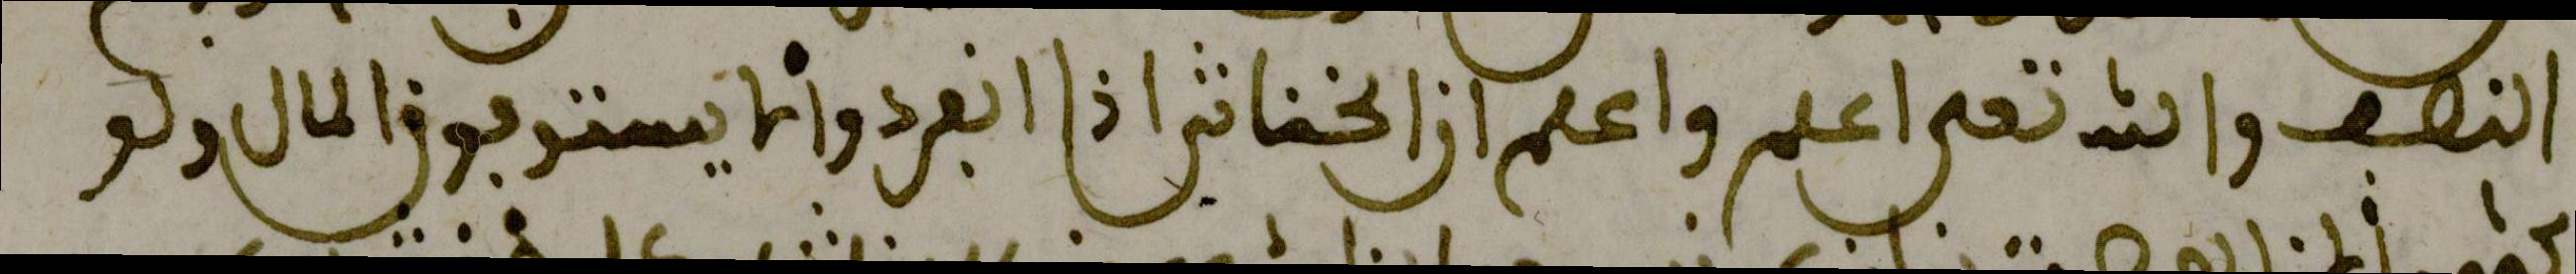النصف والله تعلى اعلم ان الخناثى اذا انفرد دوا لا يستوفون المال ولو
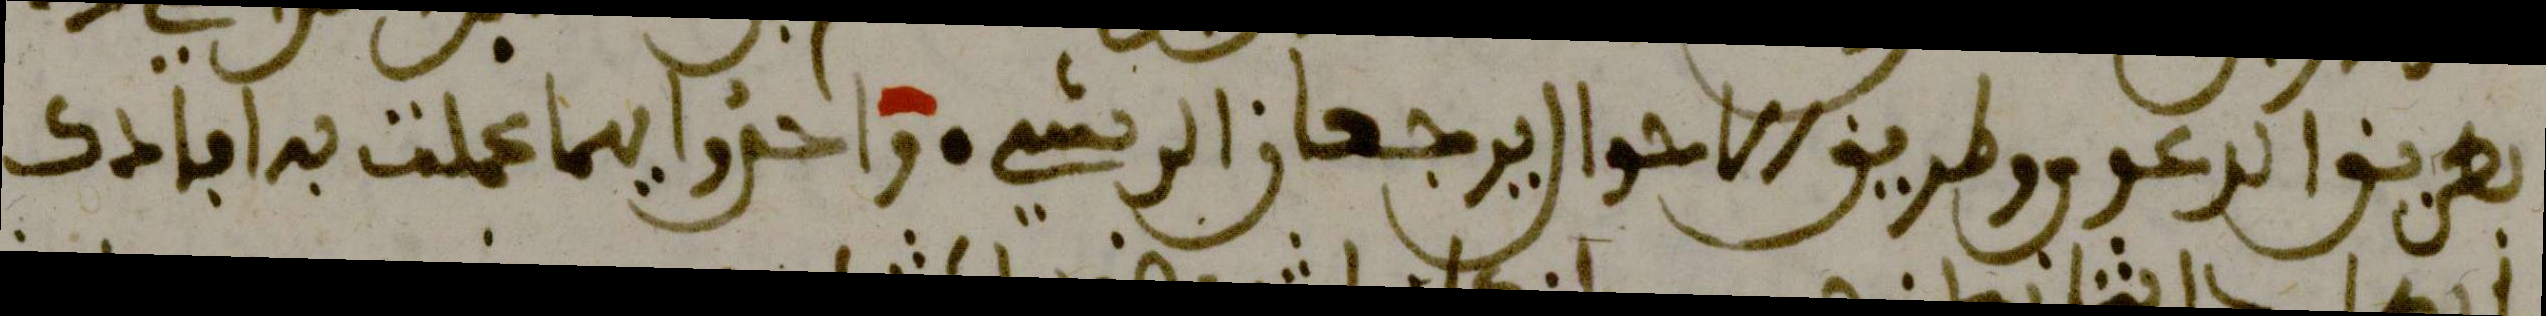بطريف الدعوى وطريق الاحوال يرجعان الى شيء وَاحد وايهما علمت به افادك
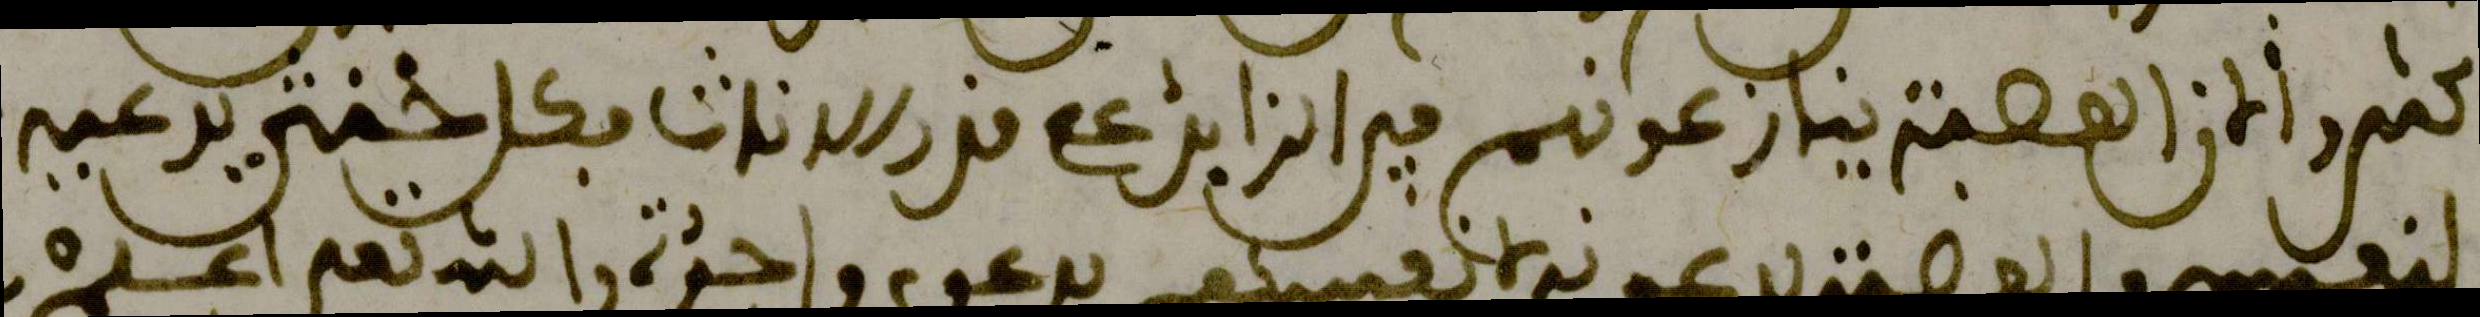كثروا لان العصبة ينازعونهم في الزائد على قدر الاناث فكل خنثى يدعيه
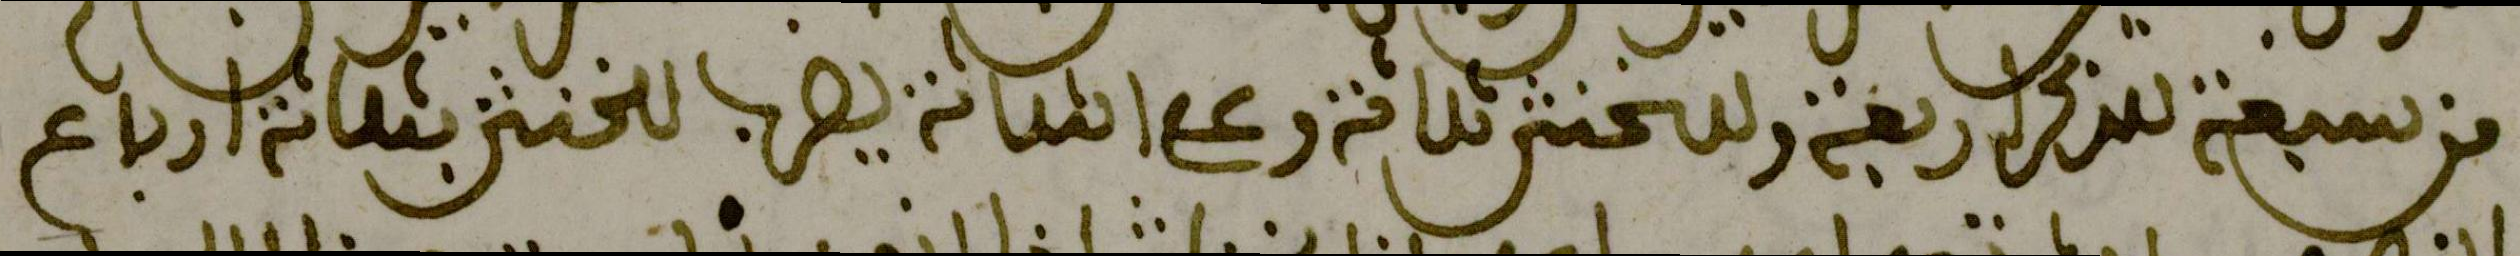من سبعة للذكر اربعة وللخنثى ثلاثة وعلى الثلاثة يضرب للخنثى بثلاثة ارباع
